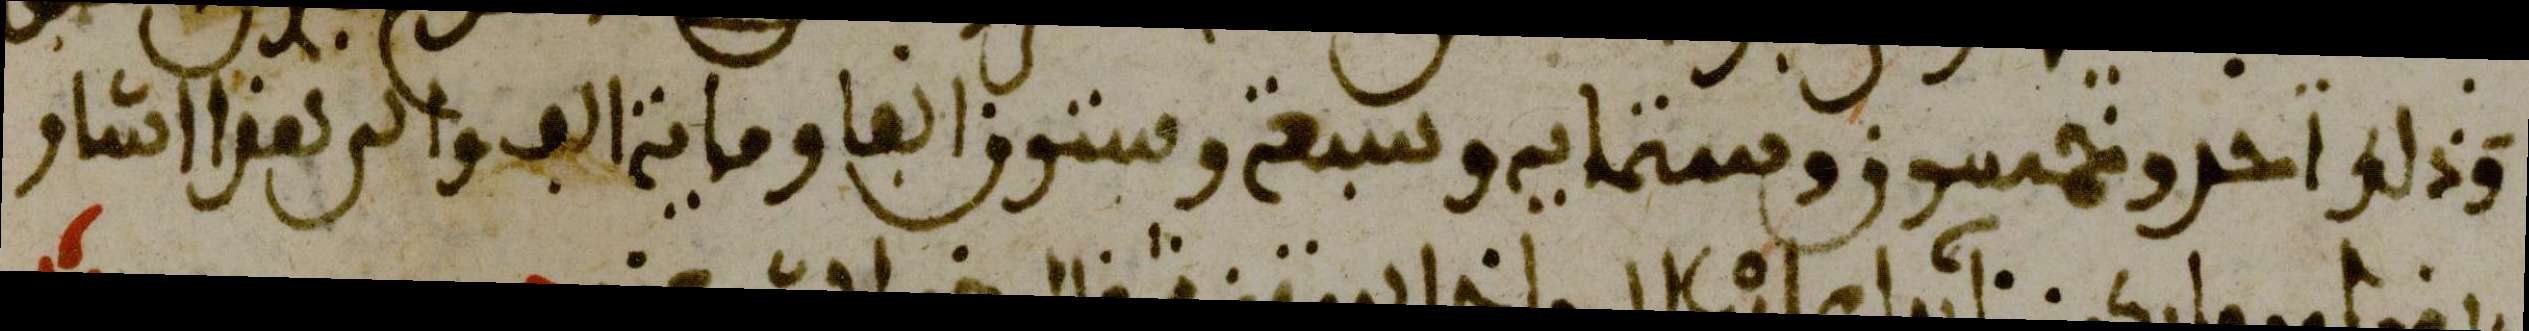وذلك احد وخمسون وستماية وسبعة وستون الفا وماية الف والى هذا اشار
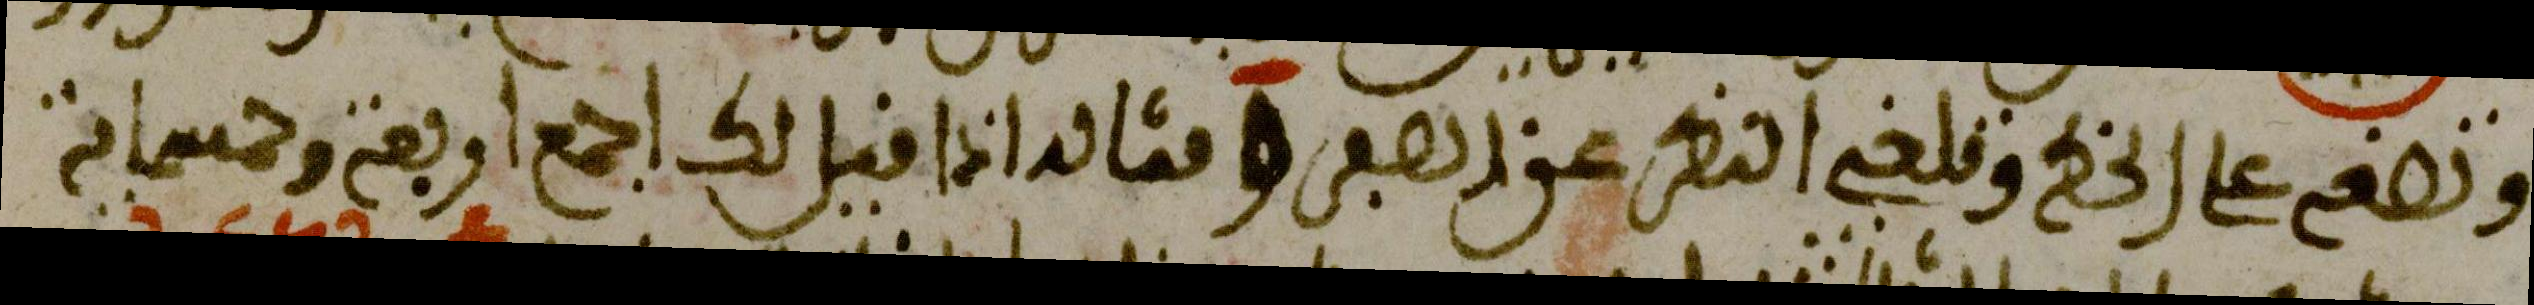وتضغه على الخط وتغلى النظر عن الصفر ومثاله اذا قيل لك اجمع اربعة وخمسماية
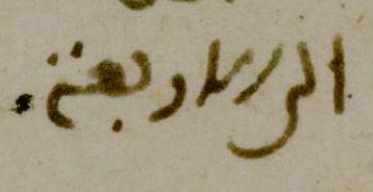الى الاربعة
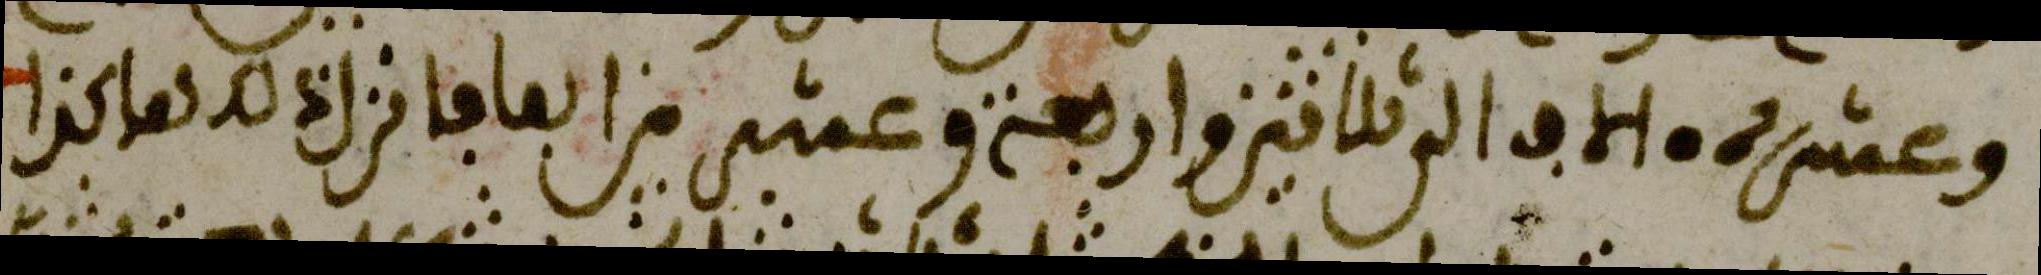وعشره ءالاف الى ثلاثين واربعة وعشرين من الفا فانزل ذلك هاكذا
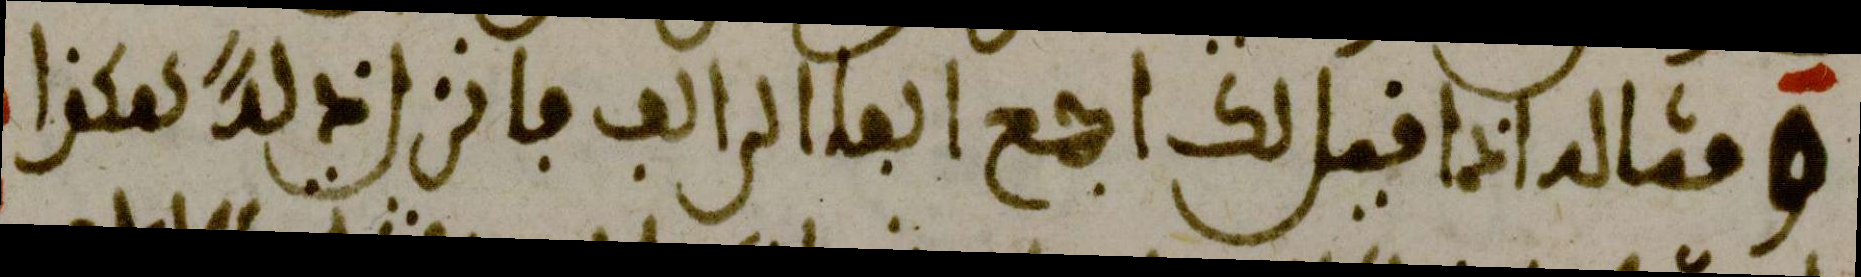ومثاله اذا قيل لك اجمع الفا الى الف فانزل ذلك
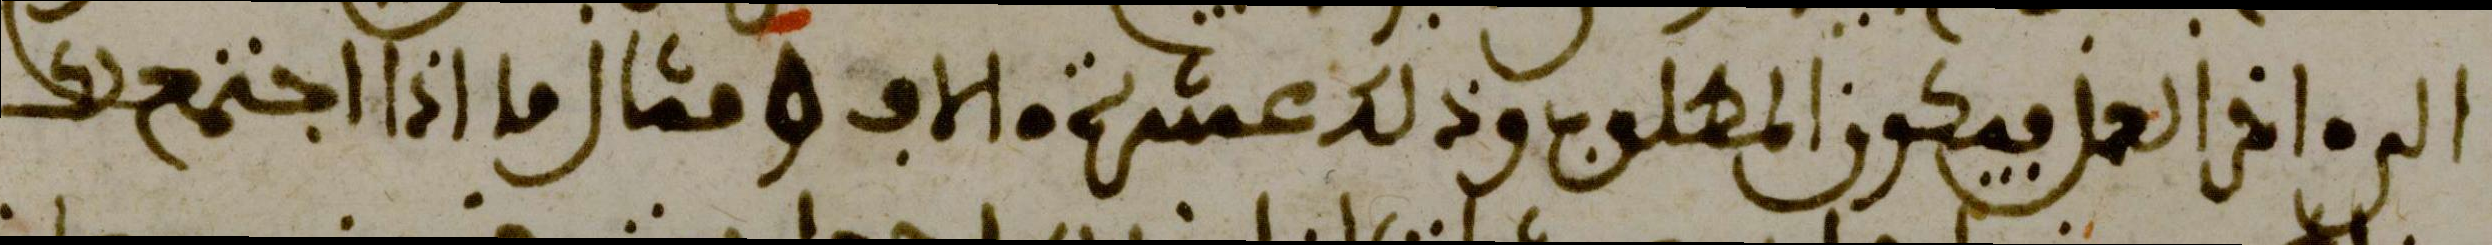الى ءاخر العمل فيكون المطلوب وذلك عشرة الاف ومثال ما اذا اجتمع لك
